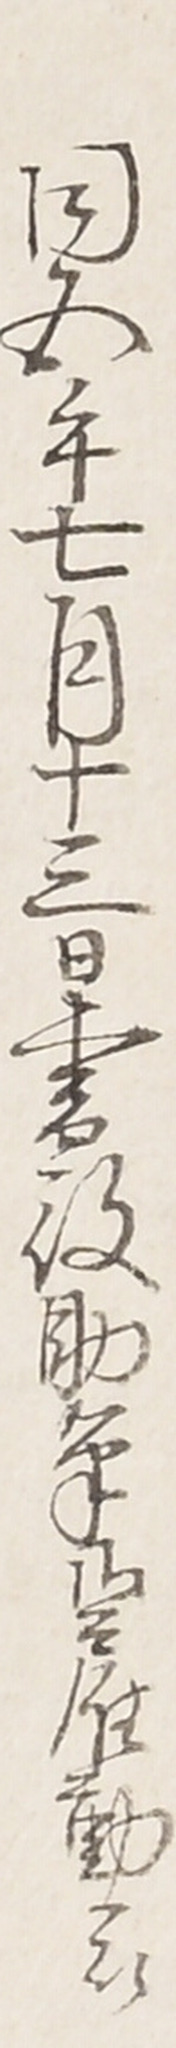一同五午七月十三日書役助筆御雇勤被
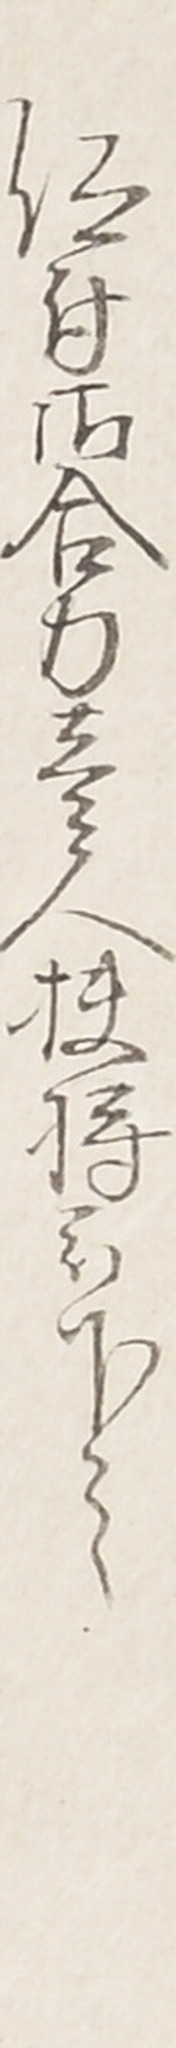仰付御合力壱人扶持被下之
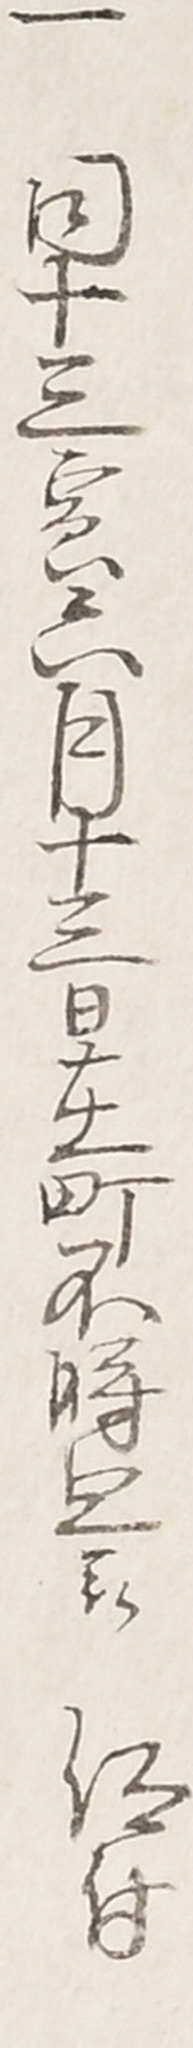一同十三寅六月十三日在町不時廻被仰付
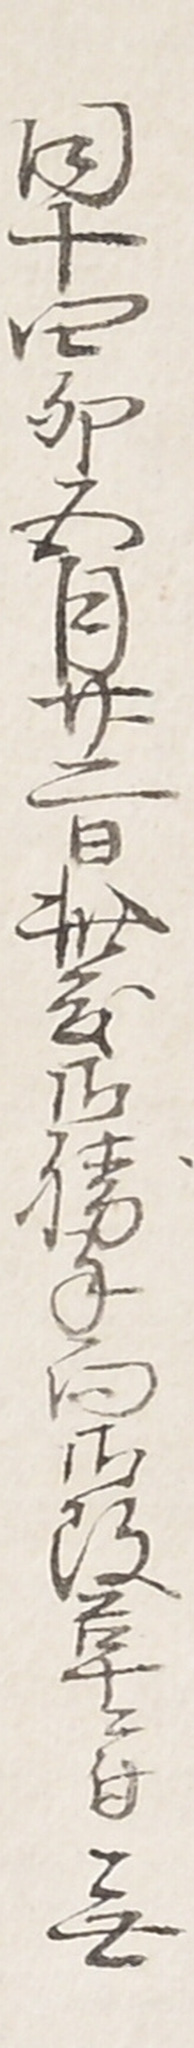一同十四卯五月廿二日此度御勝手向御改革ニ付無
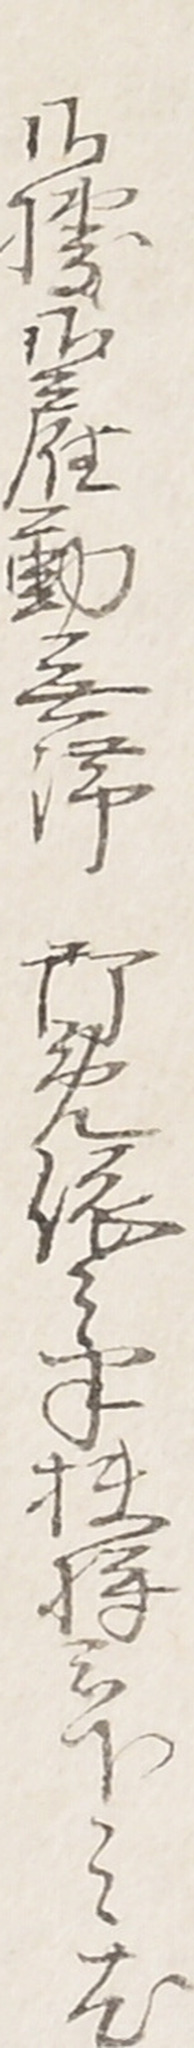御據御雇勤無滞御免依之半扶持被下之尤
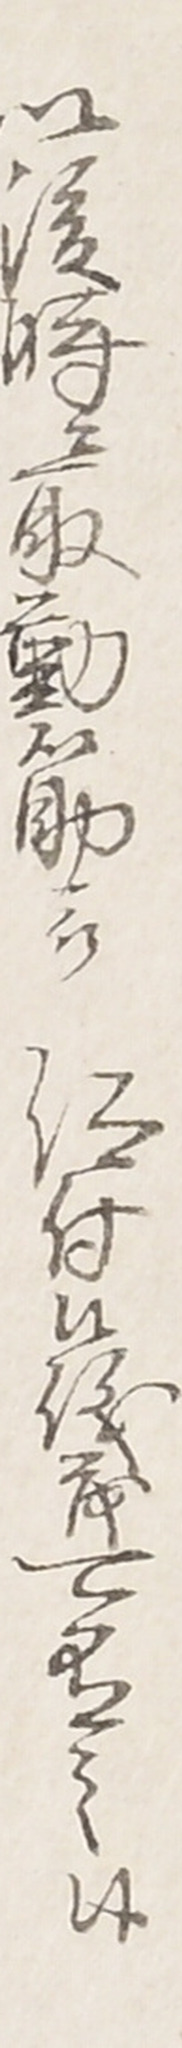以後時ニ取勤筋被仰付候義茂可有之候
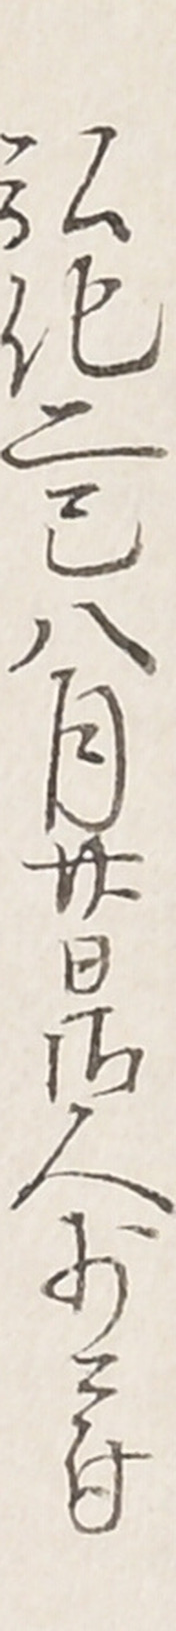一弘化二巳八月廿日御人少ニ付
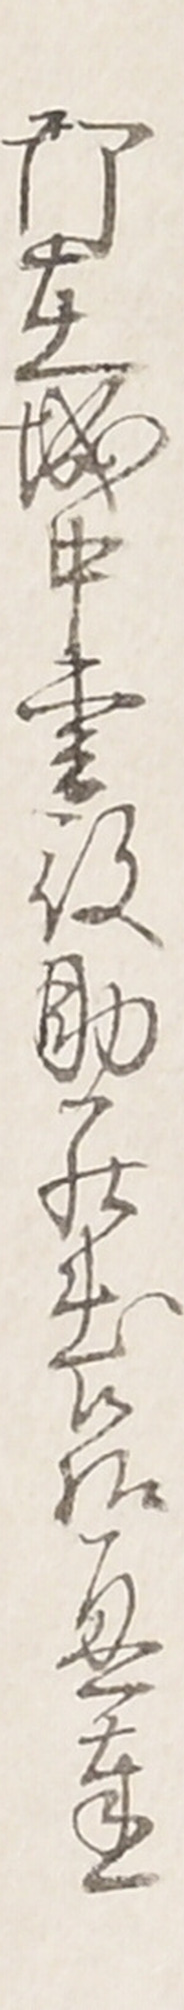御在城中書役助罷出候様通達
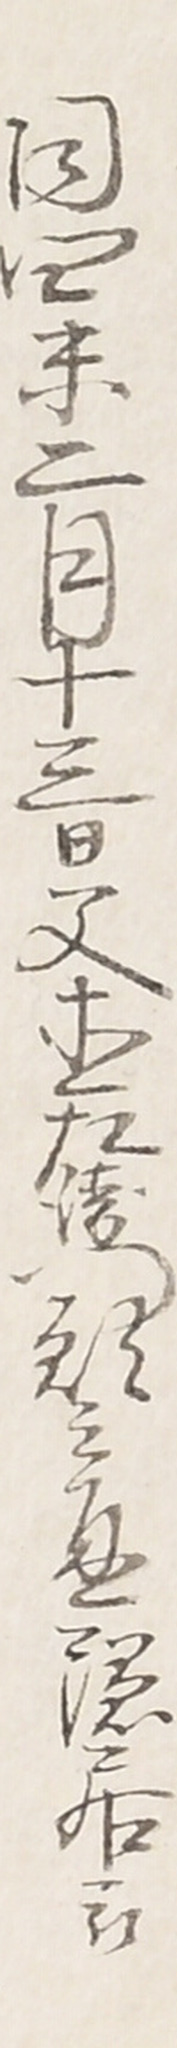一同四未二月十三日父直左衛門願之通隠居被
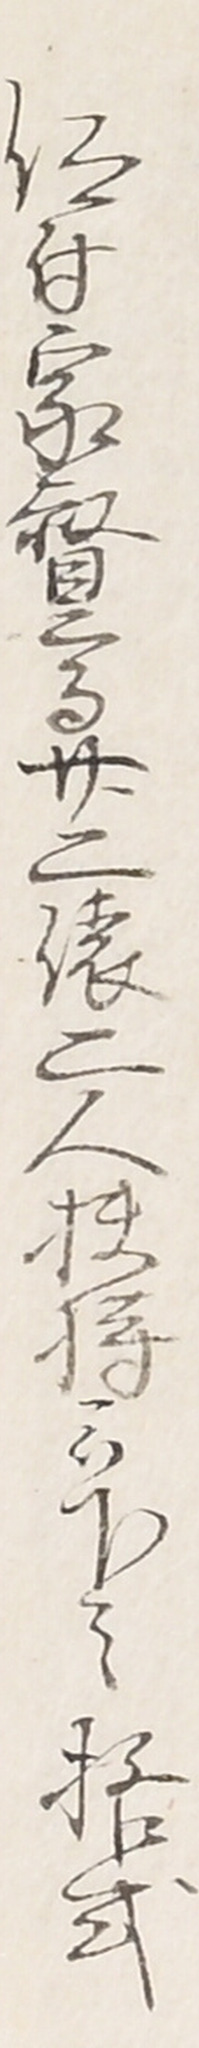仰付家督高廿二俵二人扶持被下候格式
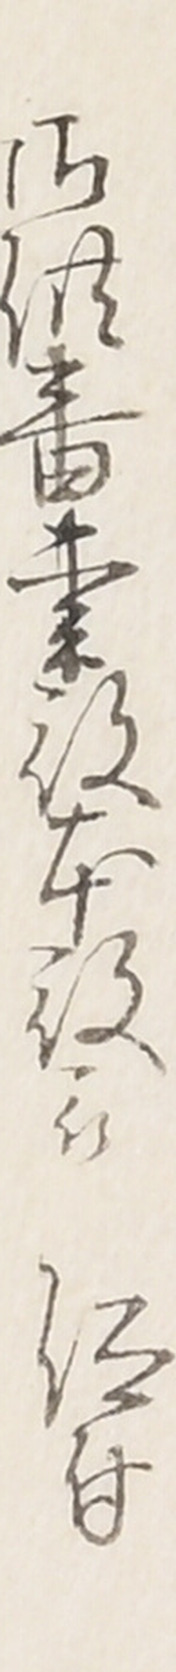御供番書役本役被仰付
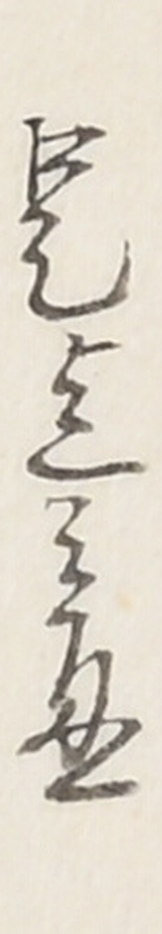是迄之通

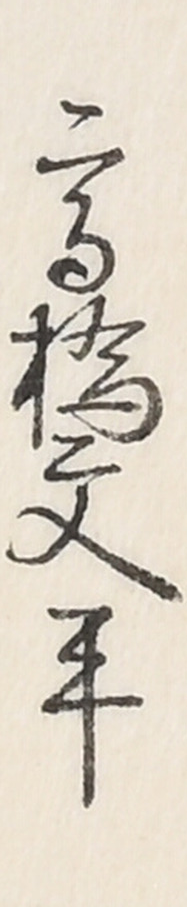高橋文平
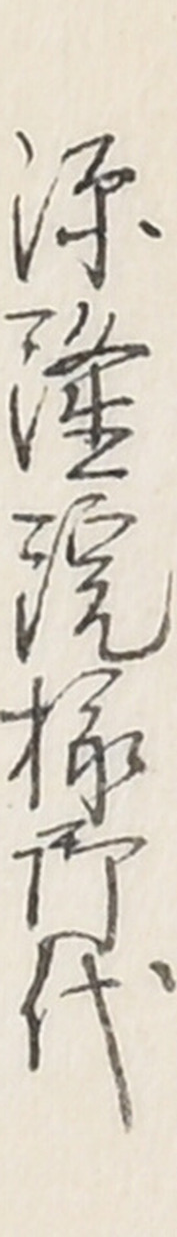源隆院様御代
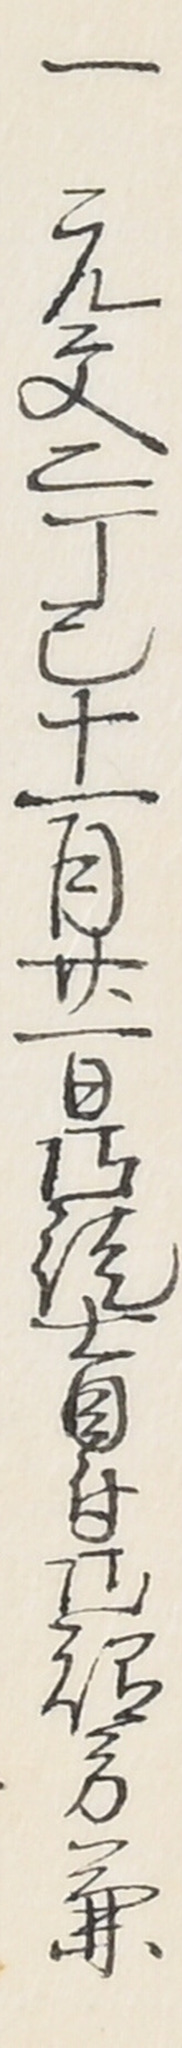一元文二丁巳十一月廿一日御徒士目付御賄方兼
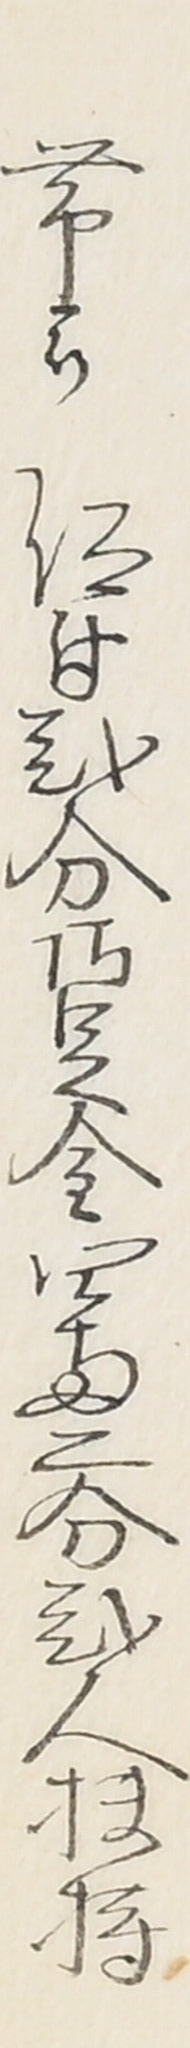帯被仰付弐分御足金四両二分弐人扶持
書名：無足諸士勤仕録（四）
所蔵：伊那市立高遠町図書館・合同会社AMANE
